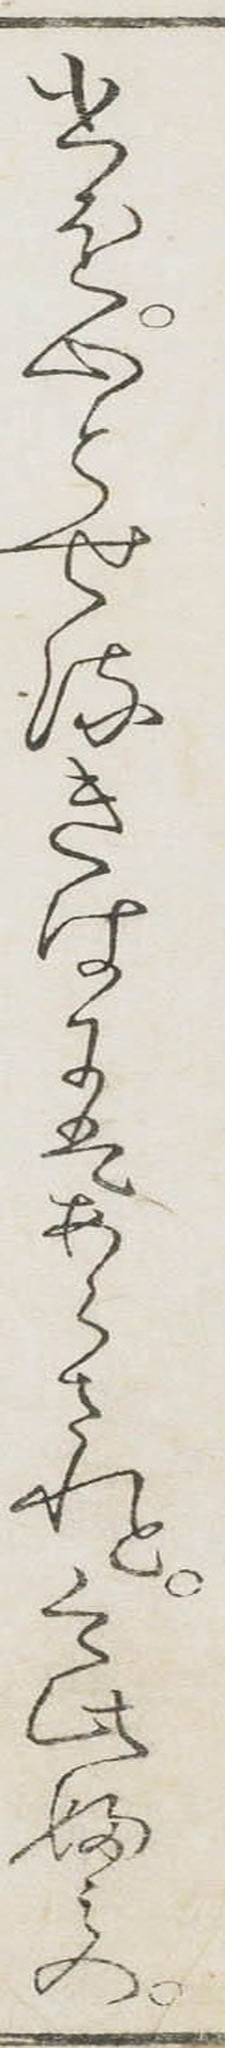書を。心とせるきはにはあらされと。今此ふみの。
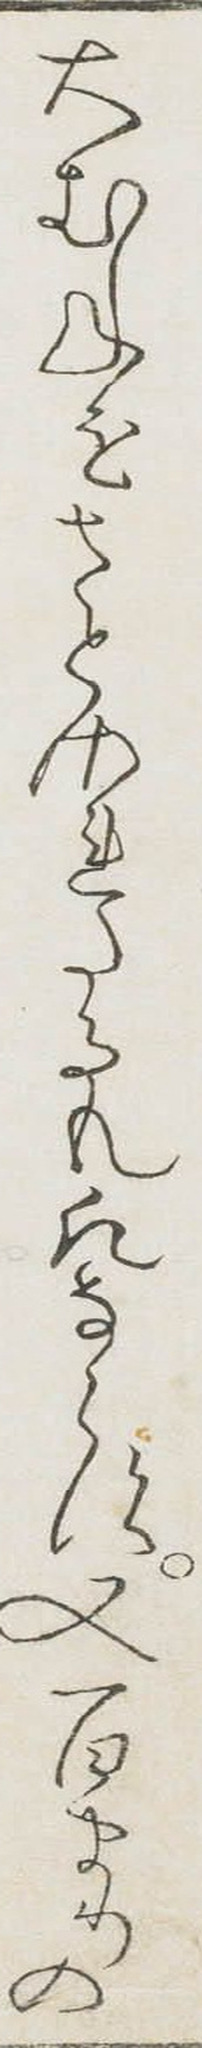大むねをさとされたるも凡ならす。又百まりの
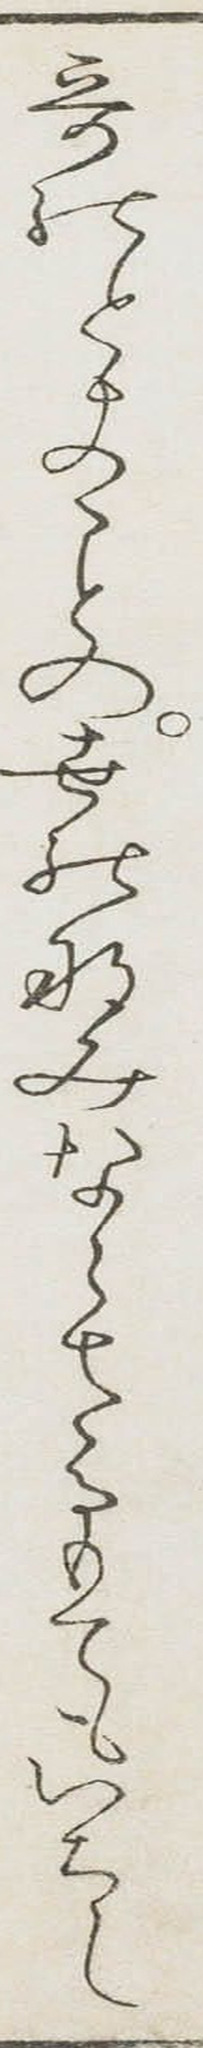哥のときのことの。世のなみならさるもてもいちし
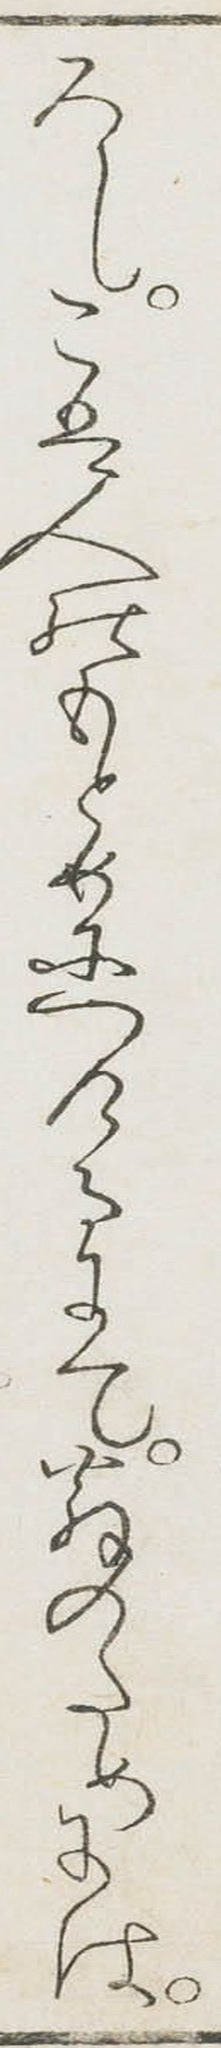ろし。こは人のもとめにつけるにて。翁のためには。
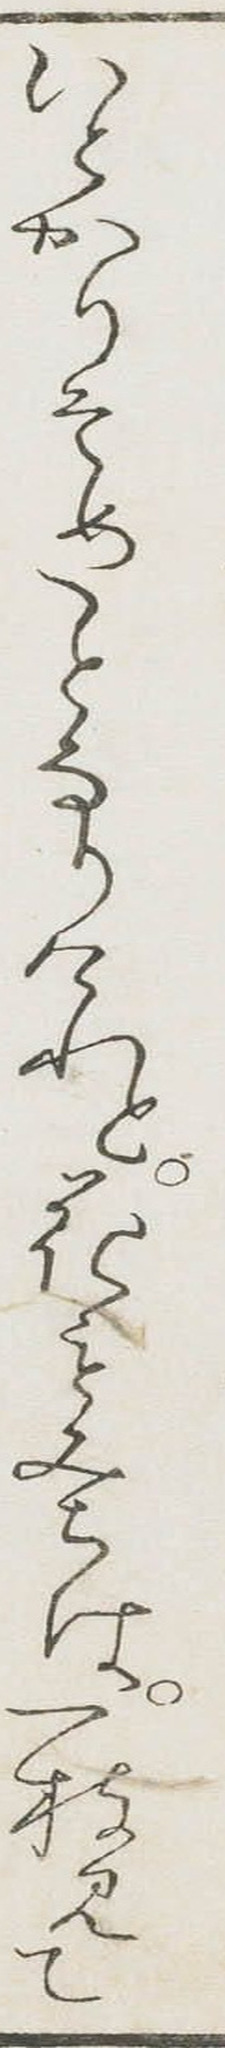いとかりそめことなりけれと。花もみちは。一枝見て
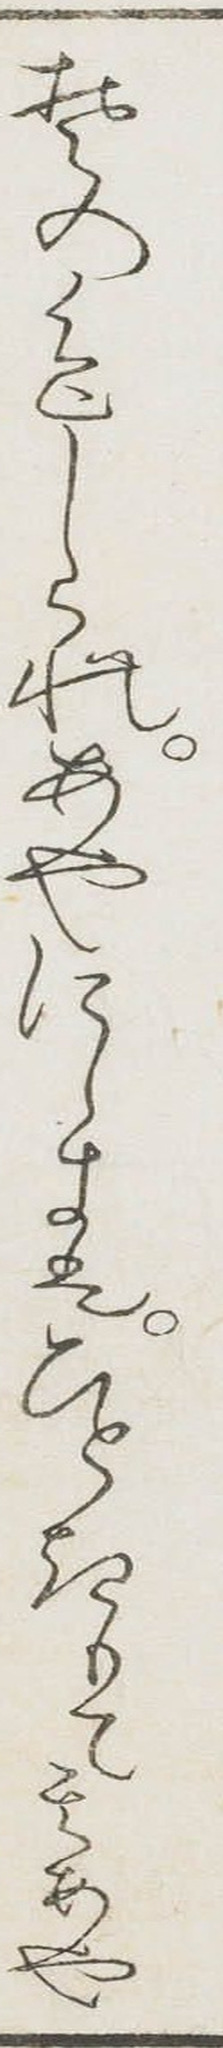その色しられ。あやにしきはひときもて其あや
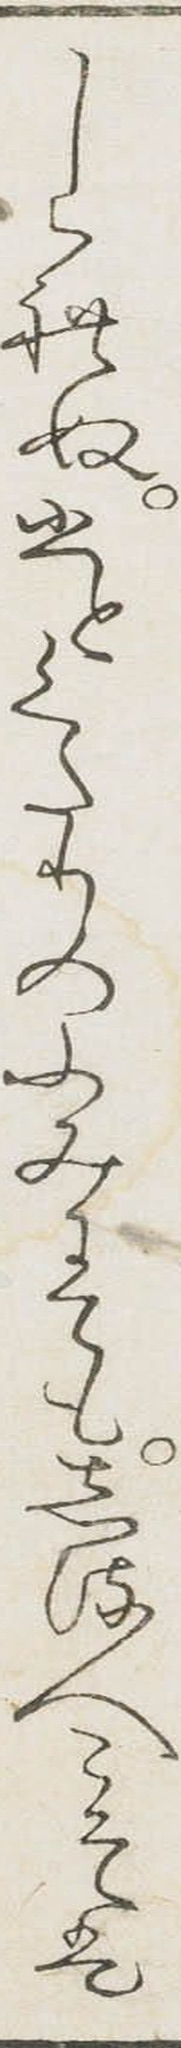しられぬ。書とくたりのふみにても。しる人こそは
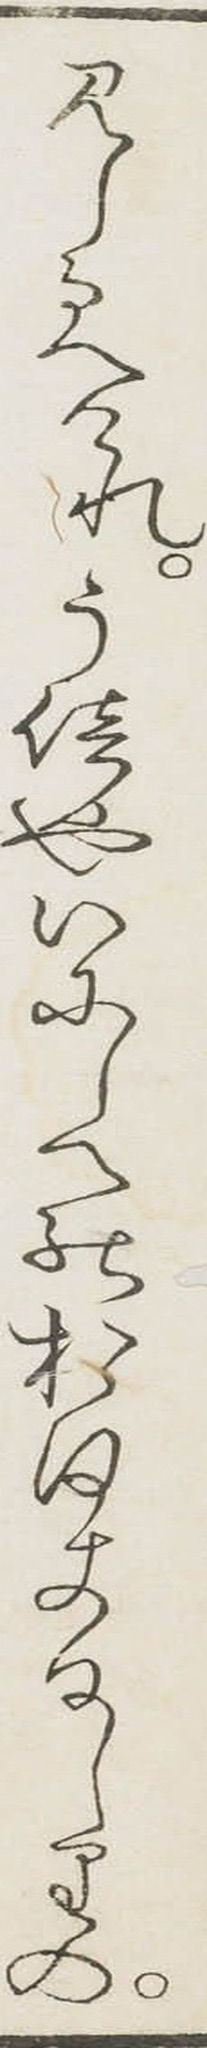見しるへけれ。うへやいにしへのおほきひしりの。
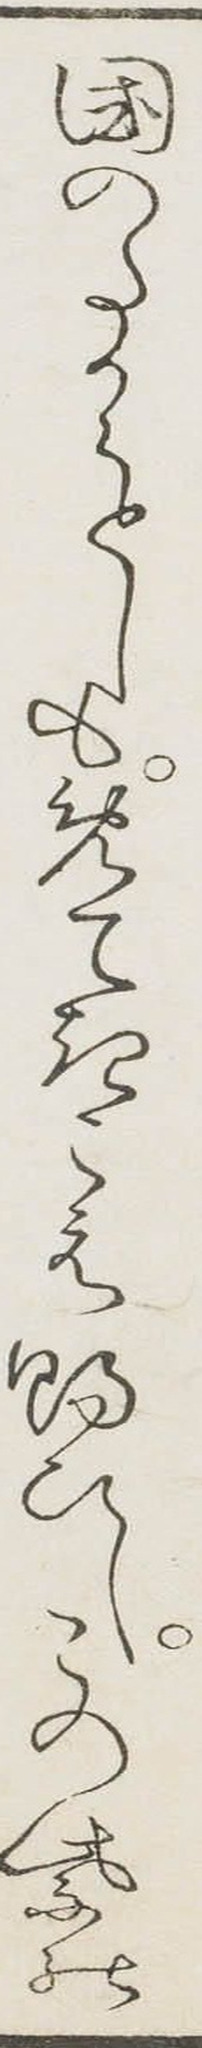国のたからとしも。めてきこえ賜ひし。この紫の
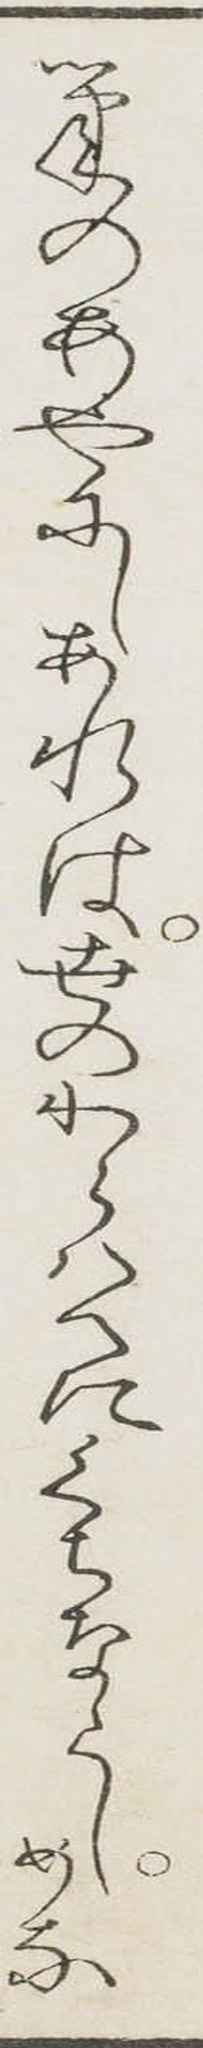筆のあやにしあれは。世のわらはへにくちならし。めな
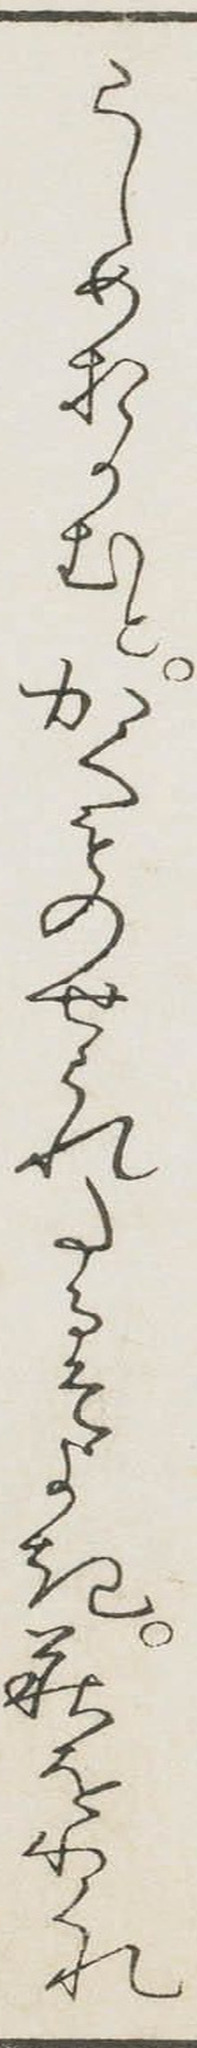らしめおかむと。かくものせられたるそよき。萩をりくれ
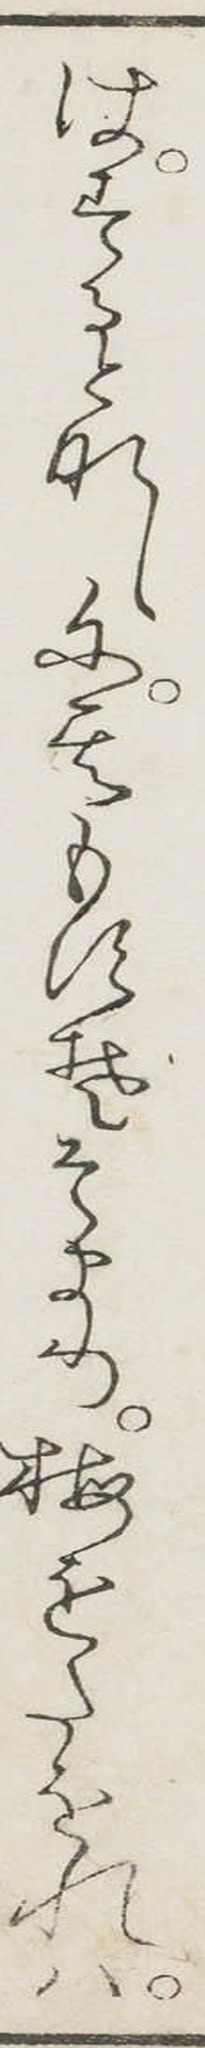は。するとなしに。其もすそそまり。桜をたをれは。
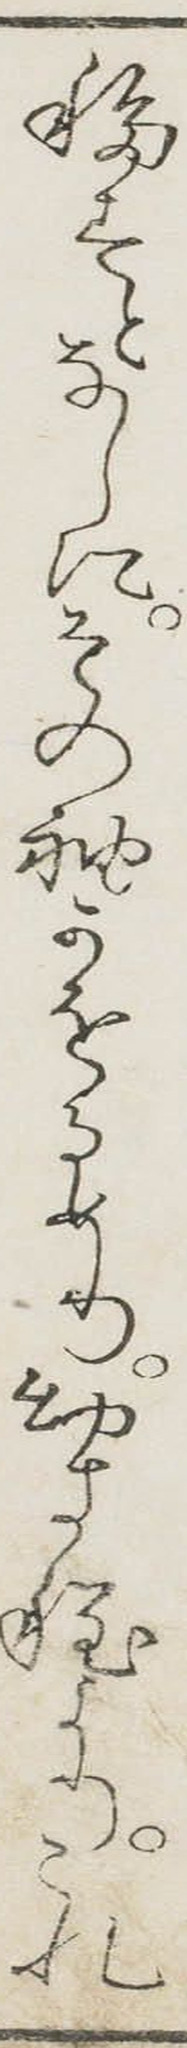移すとなしに。その袖かをるめり。幼き程より。これ
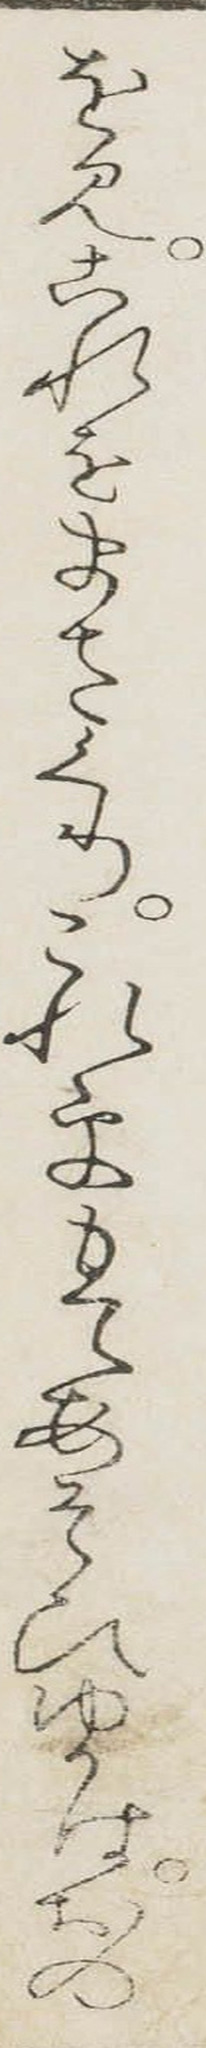を見。これをまさくり。これをもてあそひゆかは。おの
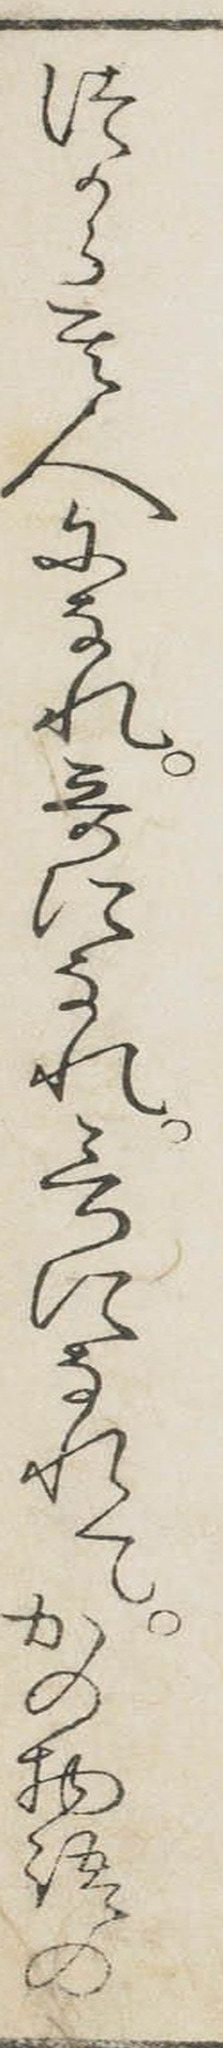つから其人になれ。哥になれ。言になれて。かの物語の

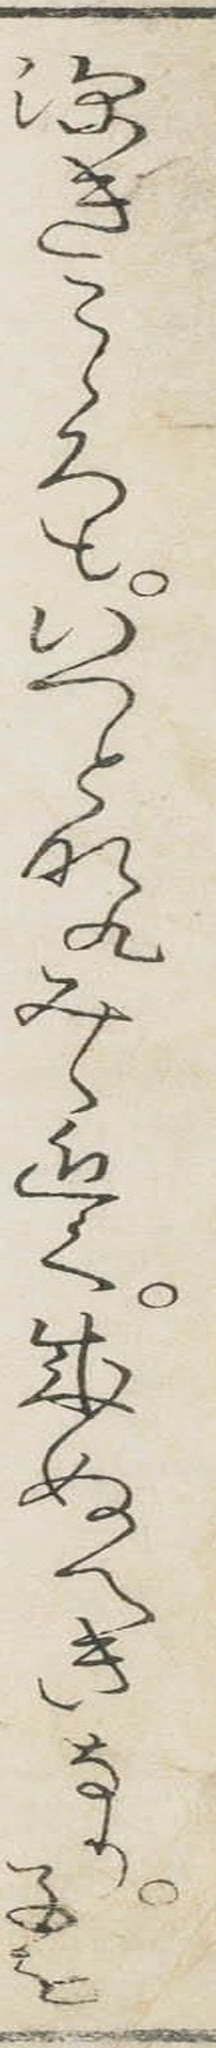深きこゝろも。いつとなくみゝ近く。成ぬへきなり。子を
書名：源氏百人一首
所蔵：東京学芸大学教育コンテンツアーカイブ
